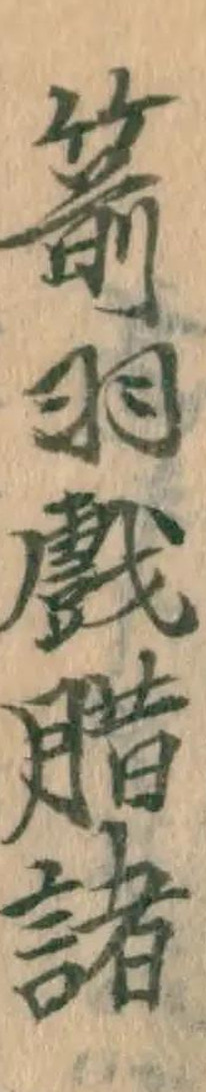箭羽戯腊諸
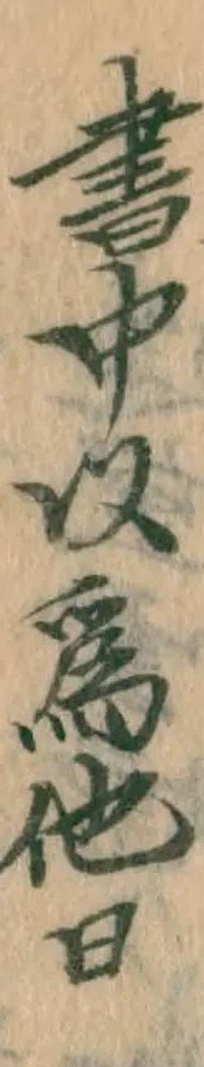書中以為他日
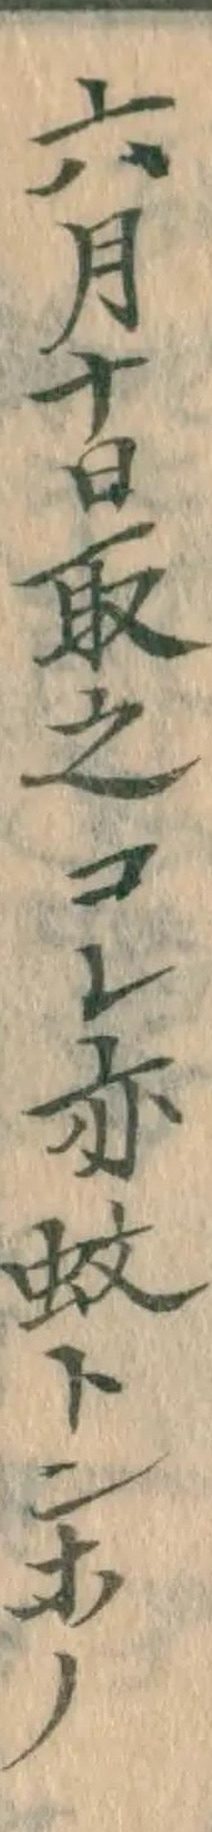六月十日取之コレ又亦蚊トンホノ
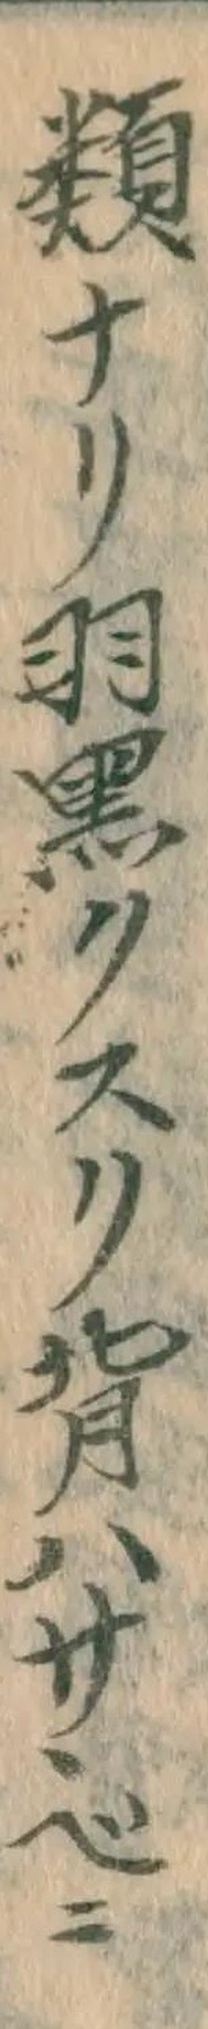類ナリ羽黒クスク背ハサヽベニ
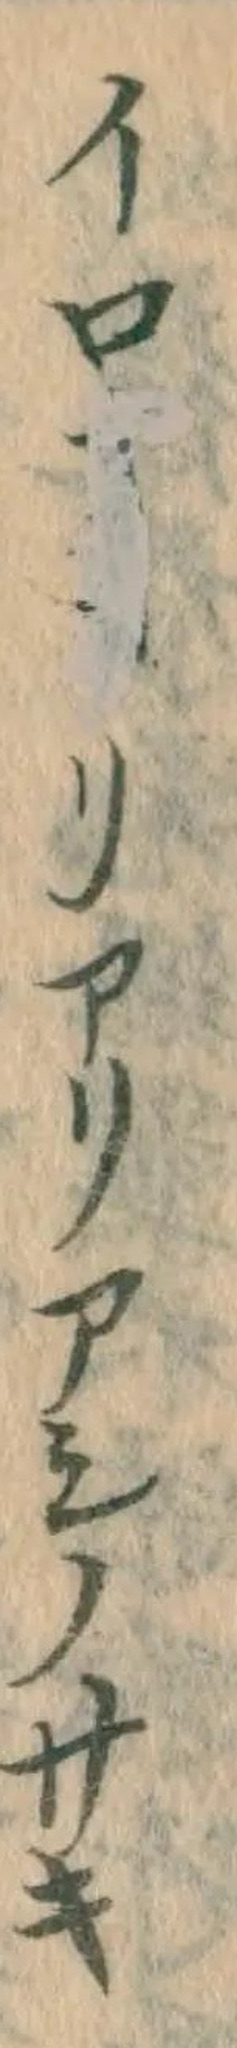イロリアリアシノサキ
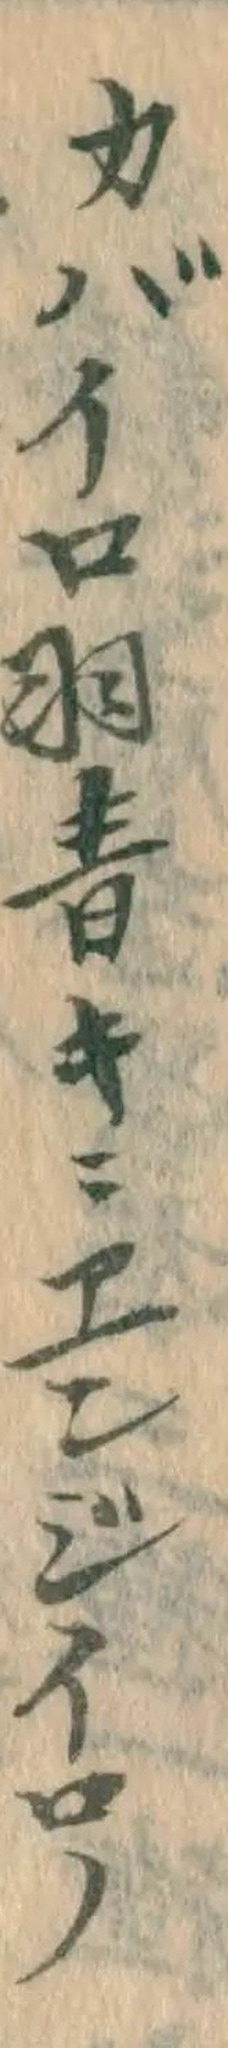カバイロ羽青キニヱンジイロノ
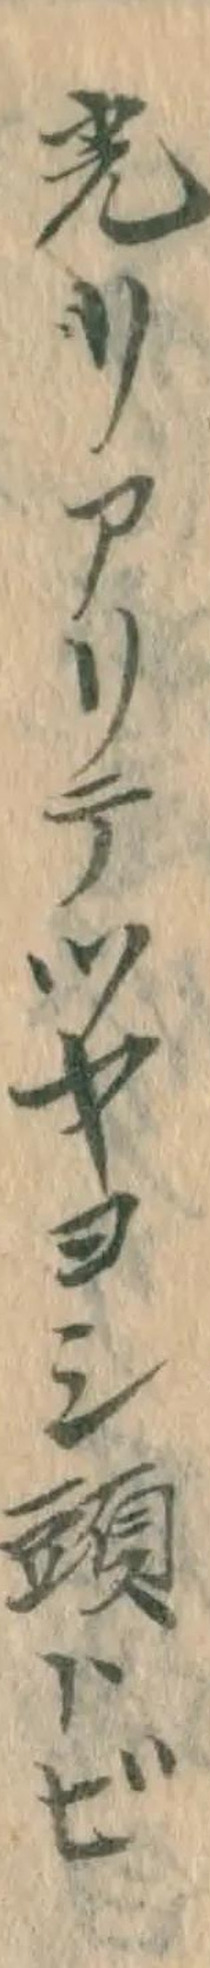光リアリテツヤヨシ頭トビ

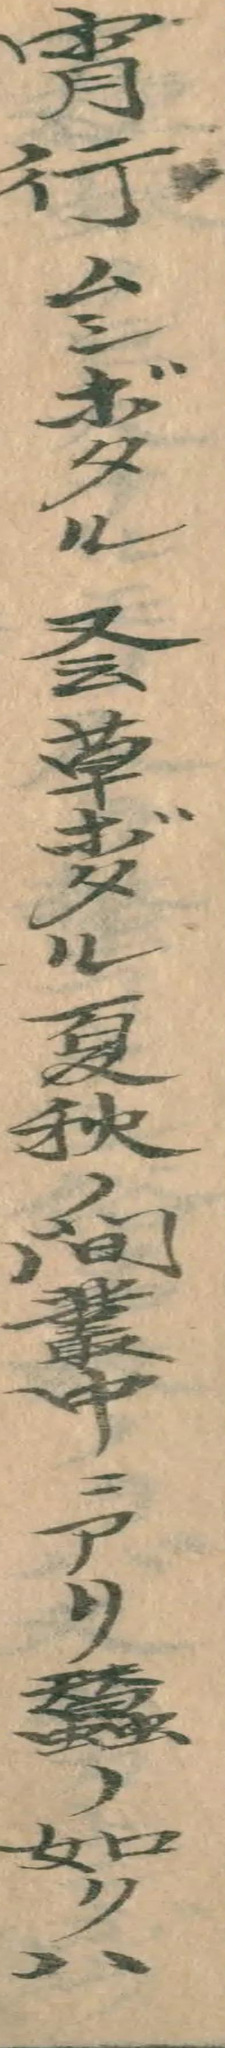宵行ムシボタル又云草ボタル夏秋ノ間叢中ニアリ蠶ノ如クハ
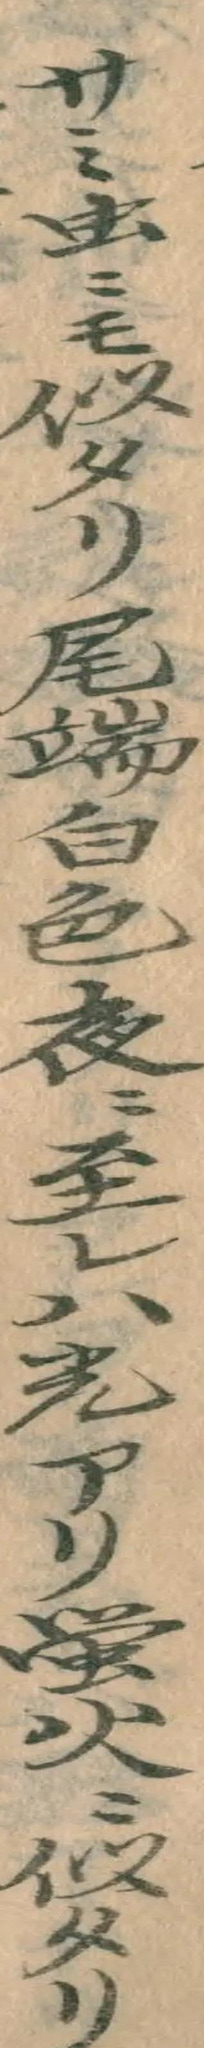サミ虫ニモ似タリ尾端白色夜ニ至レハ光アリ蛍非火ニ似タリ
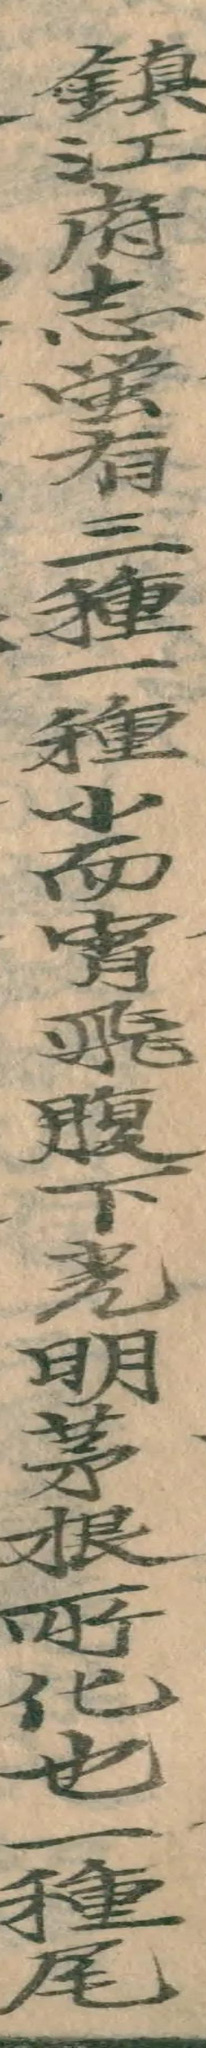鎮江府志蛍有三種一種小而宵飛腹下光明茅根所化也一種尾
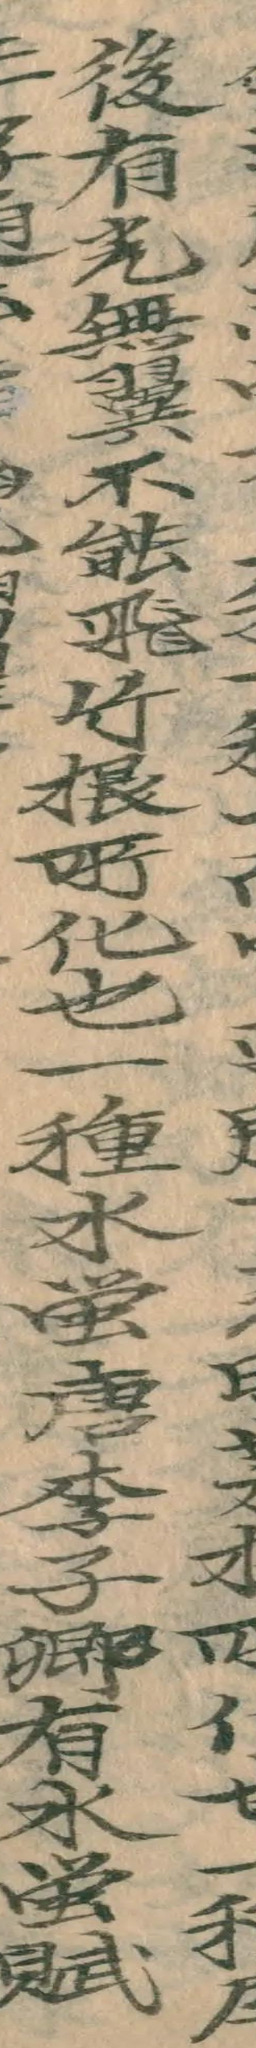後有光無翼不能飛竹根所化也一種水蛍唐李子郷有水蛍賦
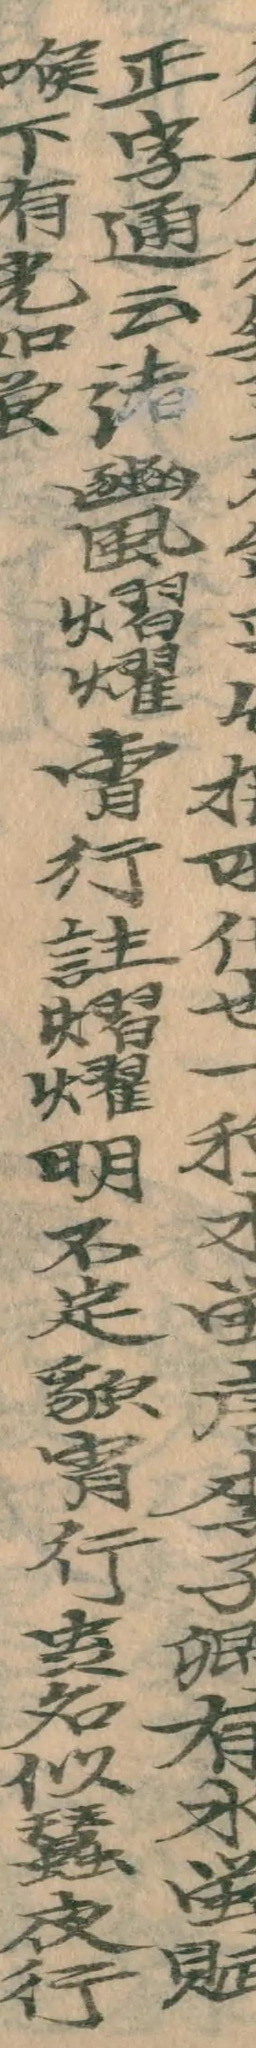正字通云諸豳風熠燿宵行註熠燿明不定貌宵行蟲名似蠶夜行
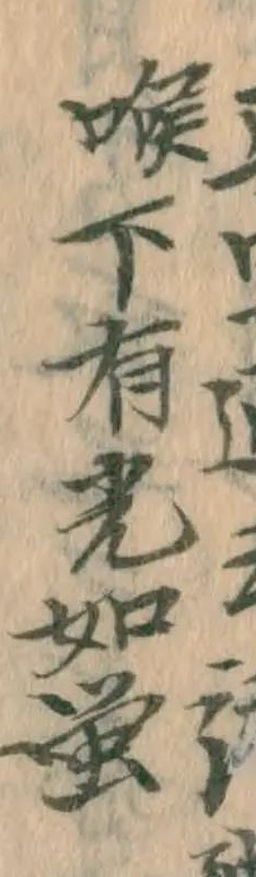喉下有光如蛍
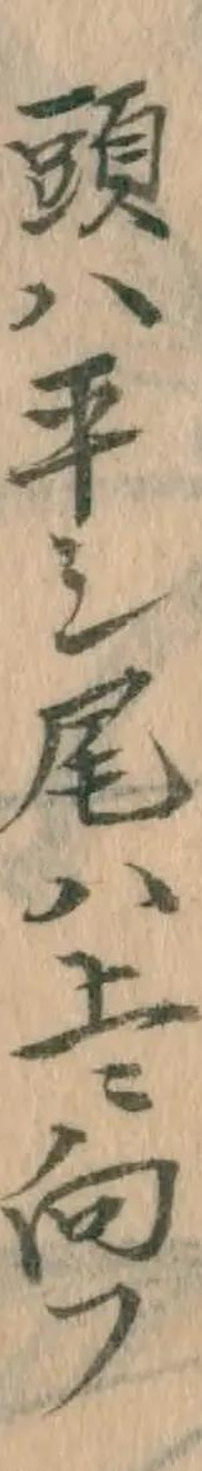頭ハ平シ尾ハ上ニ向フ
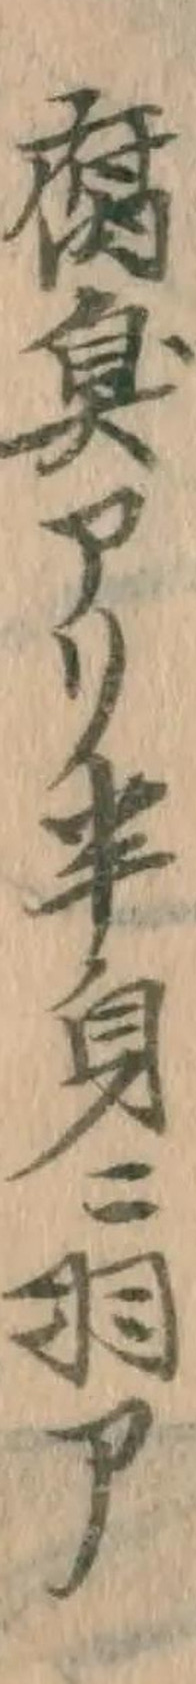腐臭アリ半身ニ羽ア
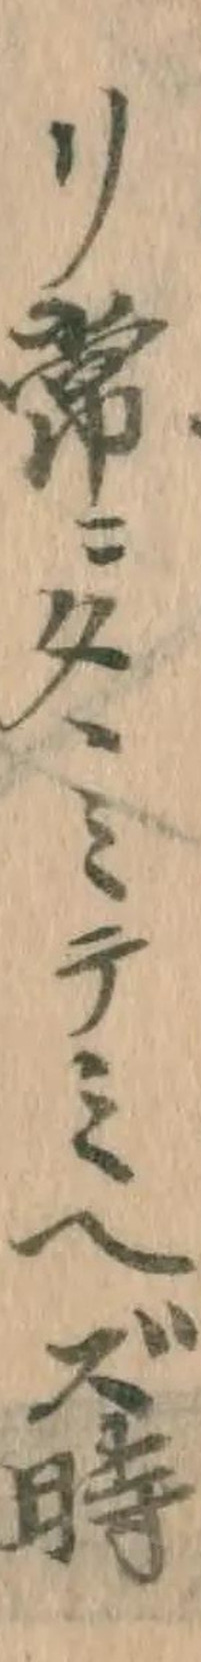リ常ニタヽミテミヘズ時
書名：千蟲譜 3巻. [2]
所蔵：国立国会図書館 National Diet Library, JAPAN
